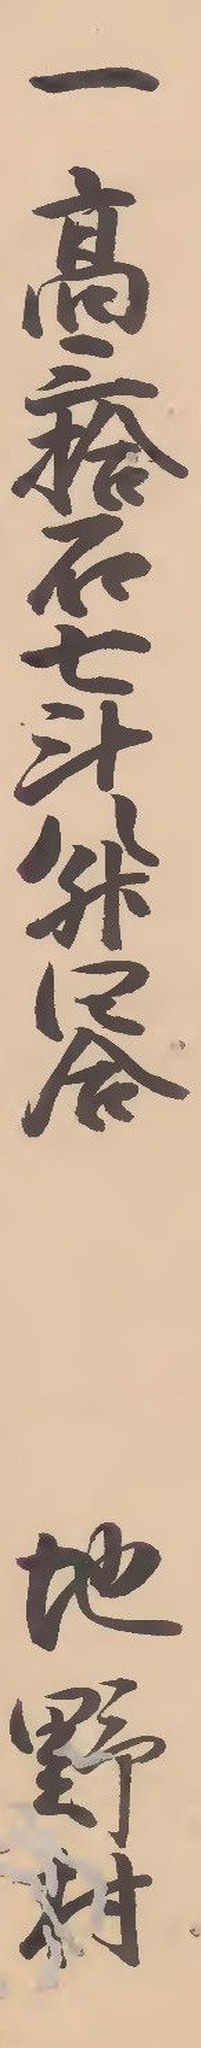一高三拾石七斗八升四合地野村
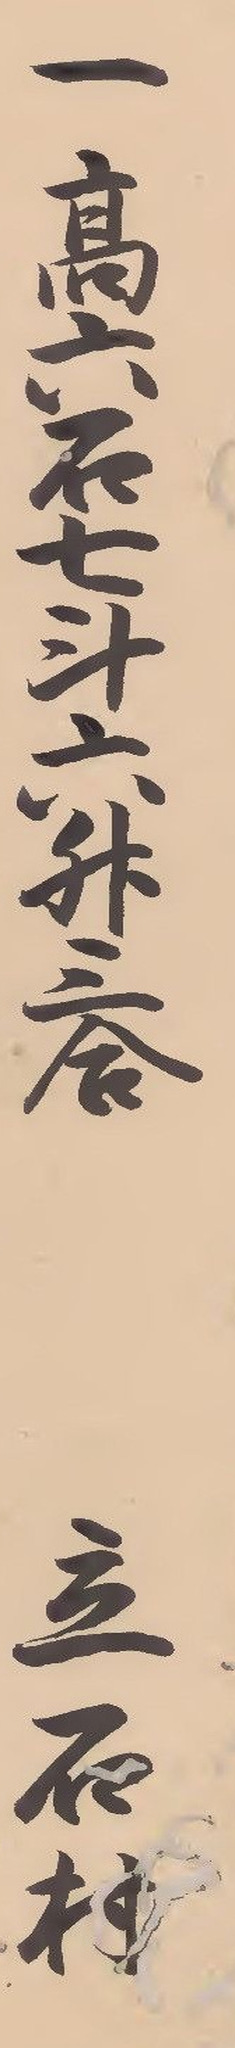一高六石七斗六升三合立石村
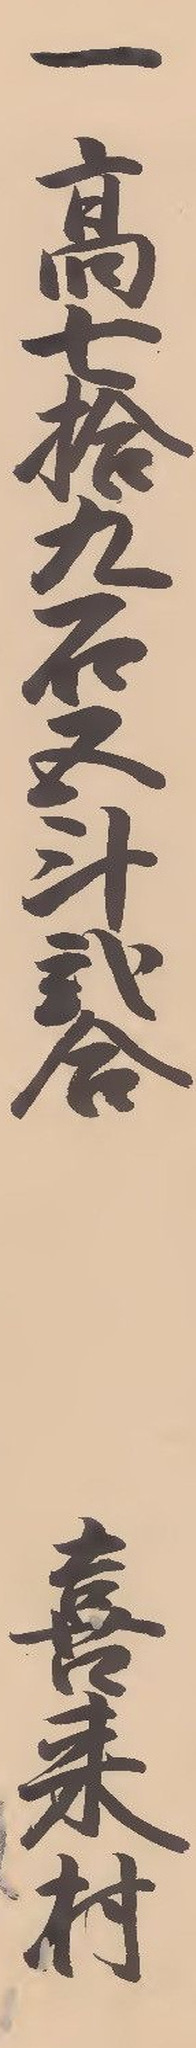一高七拾九石五斗弐合喜来村
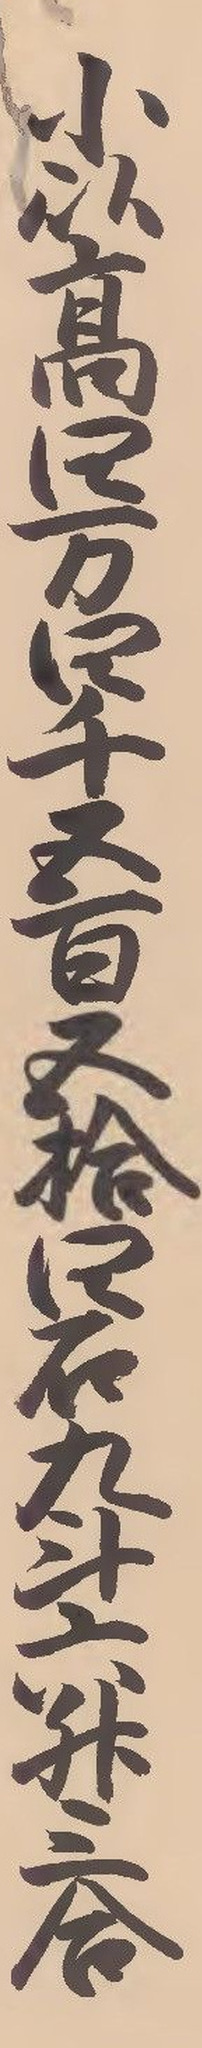小以高四万四千五百五拾四石九斗六升三合

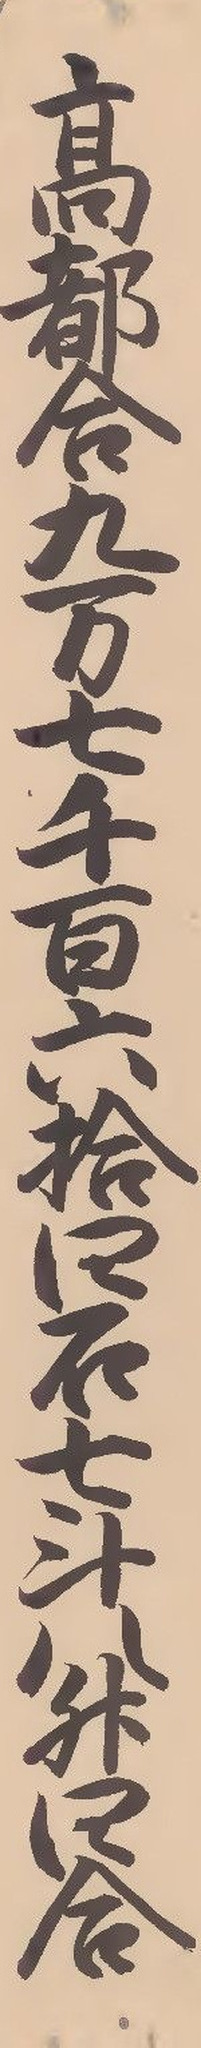高都合九万七千百六拾四石七斗八升四合
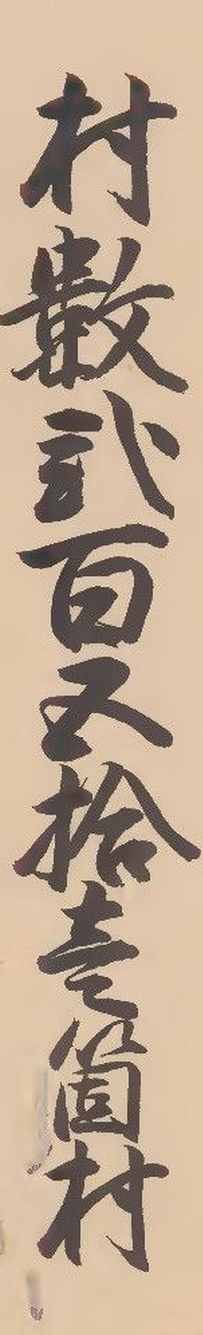村数弐百五拾壱箇村
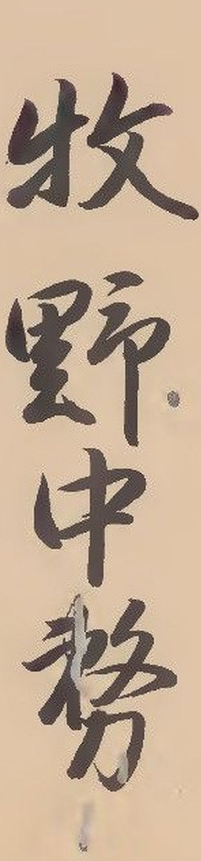牧野中務
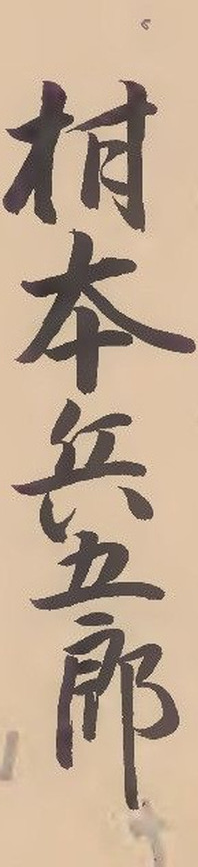柑本兵五郎
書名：淡路国郷帳
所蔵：国立公文書館 National Archives of Japan
